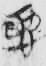惃
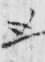之
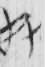奴
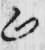㠯（以）
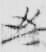至（致）
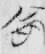命
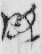阩
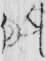門
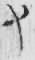又（有）
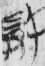敗
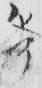秀
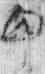免
